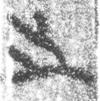之
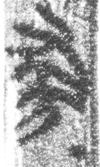○（畫）
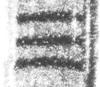三
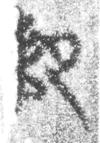厀（漆）
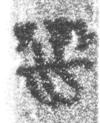○（瑟）
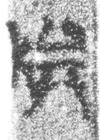桊
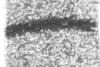一
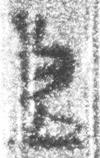良
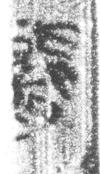○（翇）
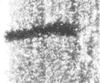一
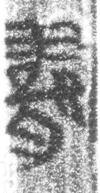○（翇）
